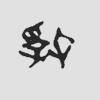{孚攴}
